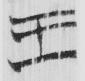王
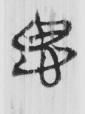思
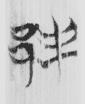邦
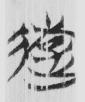遊
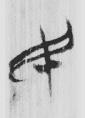民
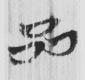厽
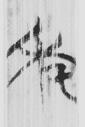年
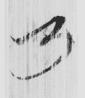乃
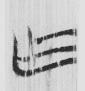乍
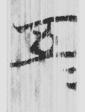五=
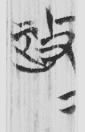政=
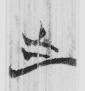之
